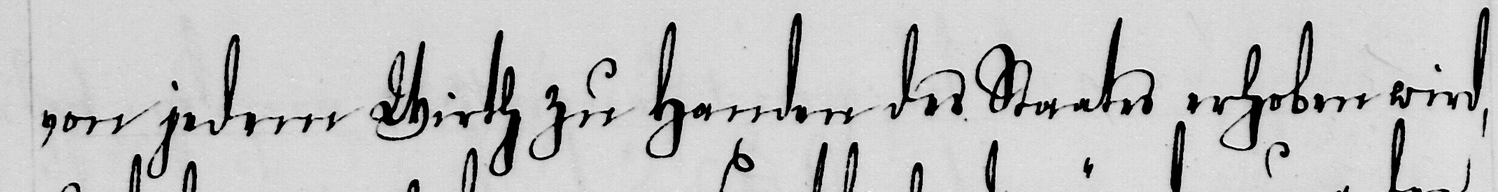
von jedem Wirth zu Handen des Staates erhoben wird,
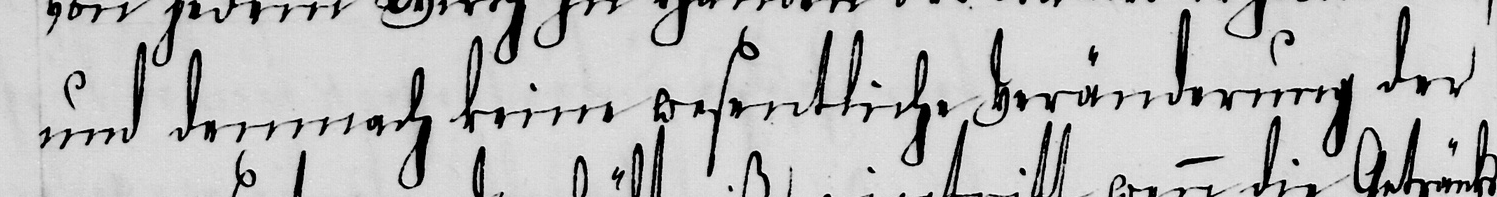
und demnach keine wesentliche Veränderungen der
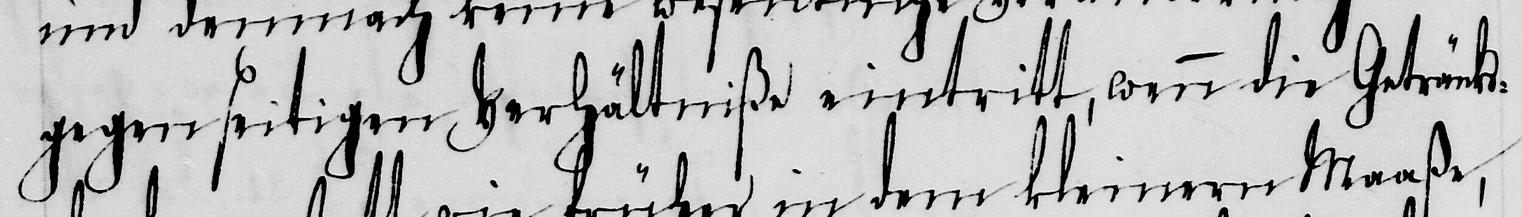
gegenseitigen Verhältniße eintritt, wenn die Getränk¬
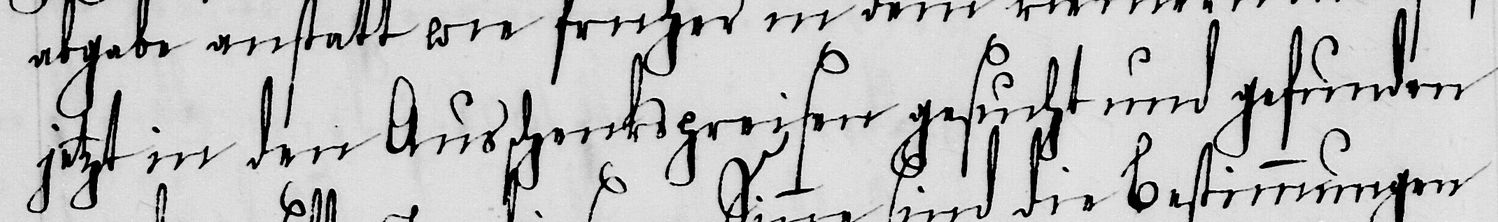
jetzt in den Ausschenkspreisen gesucht und gefunden
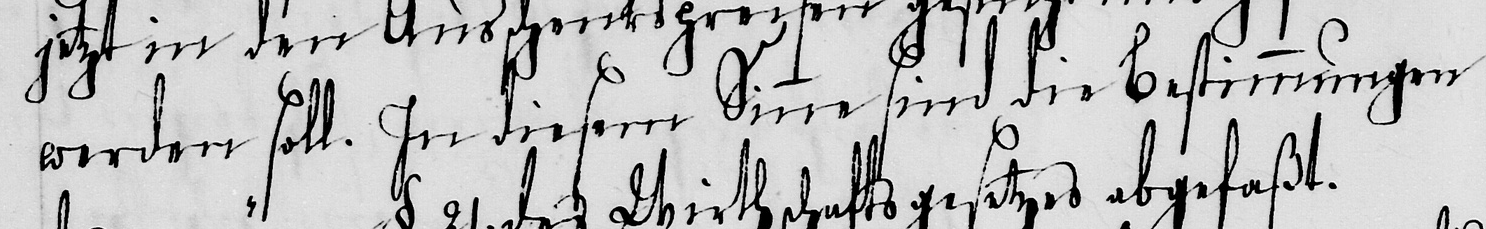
werden soll. In diesem Sinne sind die Bestimmungen
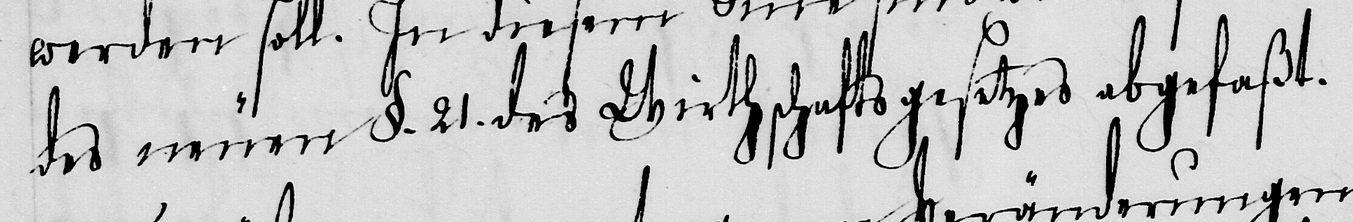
des neuen §. 21. des Wirthschaftsgesetzes abgefaßt.
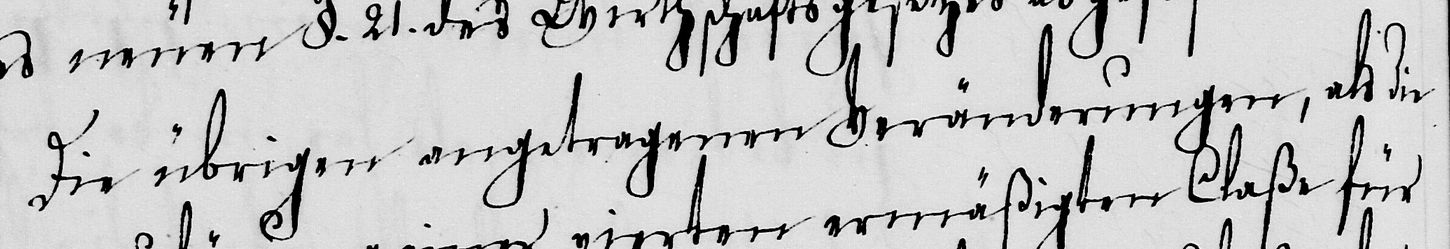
Die übrigen angetragenen Veränderungen, als die
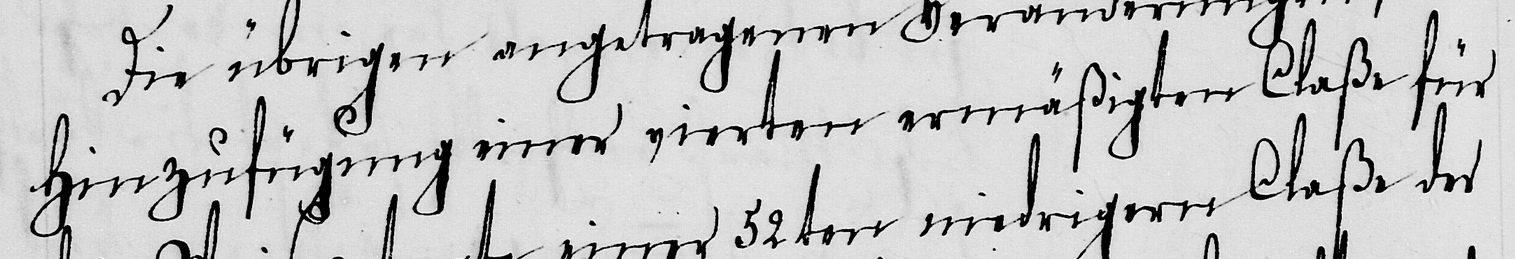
Hinzufügungen einer vierten ermäßigten Claße für
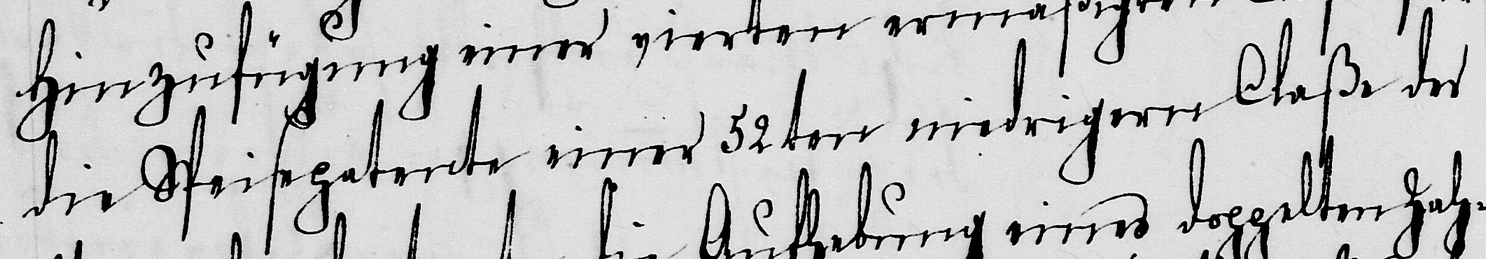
die Speisepatente einer 52ten niedrigern Claße der
